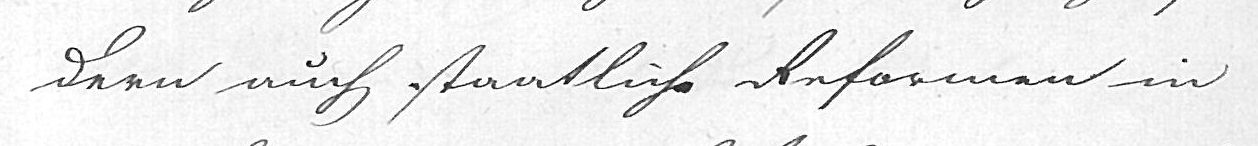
dern auch staatliche Reformen in
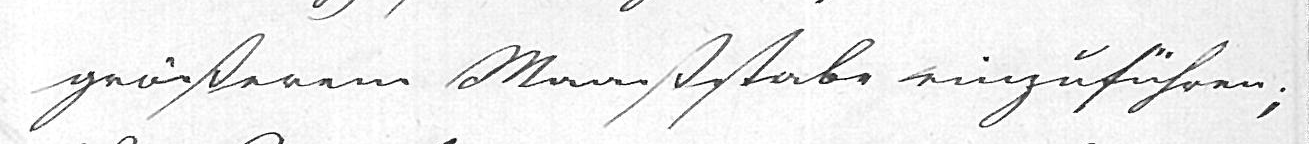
größerem Maaßstabe einzuführen;
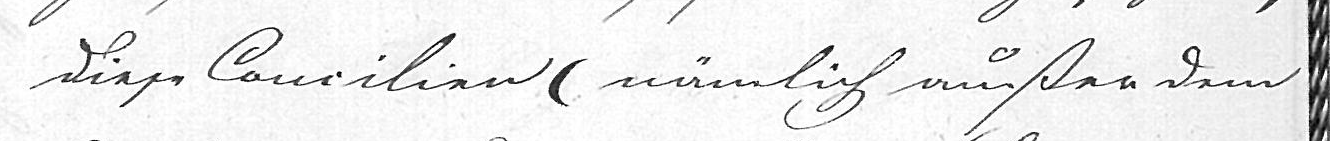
diese Concilien (nämlich außer dem
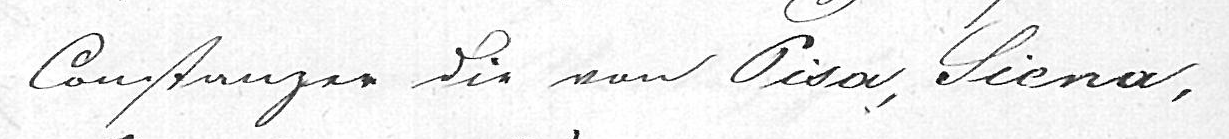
Constanzer die von Pisa, Siena,
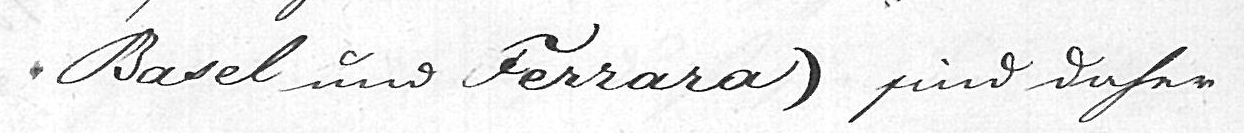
Basel und Ferrara) sind daher
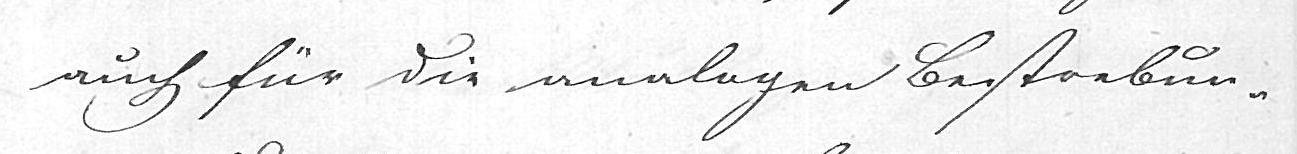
auch für die analogen Bestrebun-
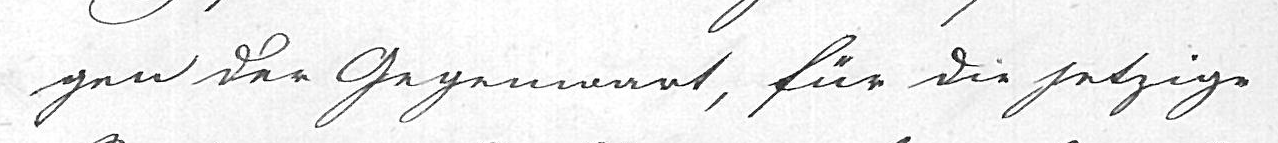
gen der Gegenwart, für die jetzige
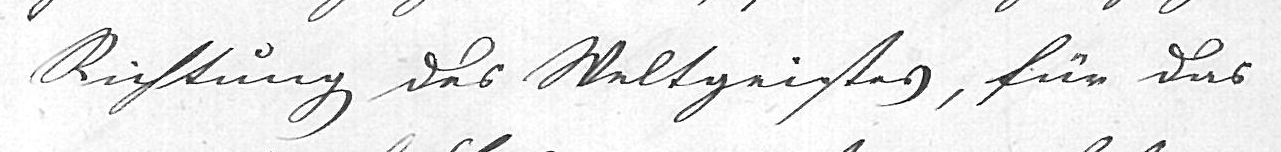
Richtung des Weltgeistes, für das
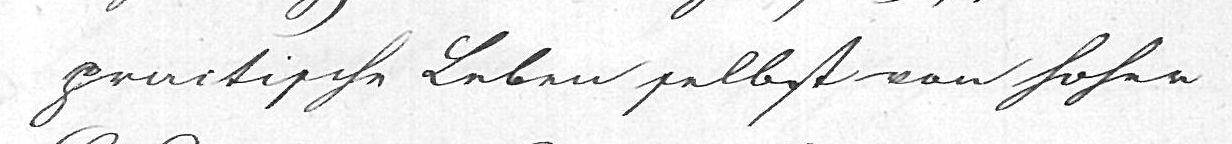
practische Leben selbst von hoher
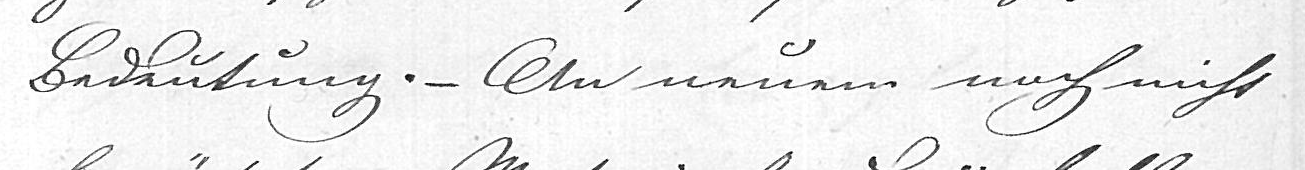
Bedeutung. - An neuem noch nicht
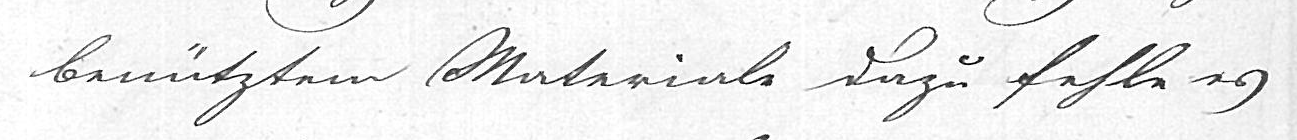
benütztem Materiale dazu fehle es
